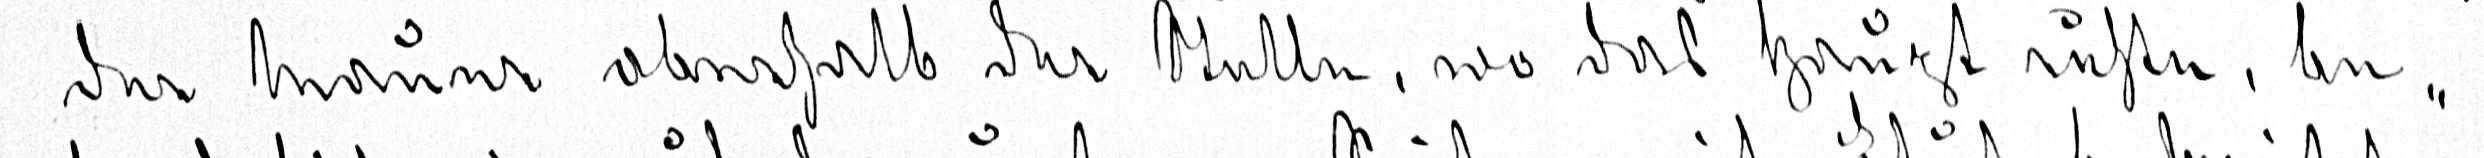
der Mauer oberhalb der Stelle, wo das Haupt ruhte, be¬
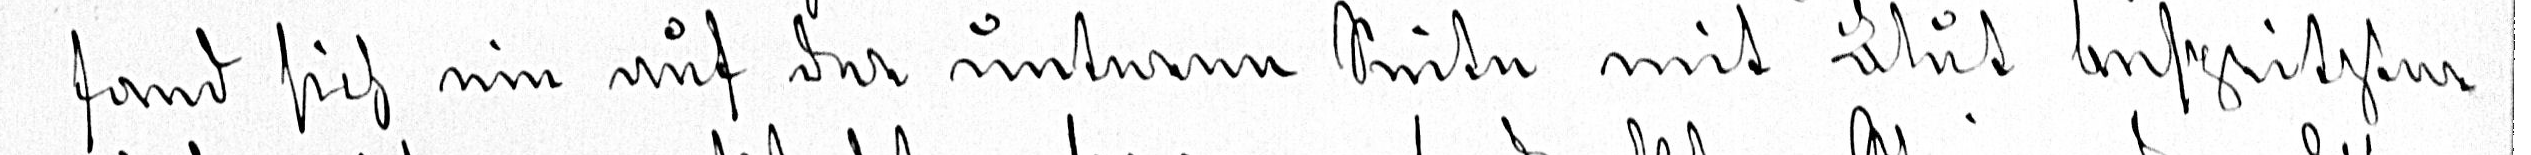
fand sich ein auf der unteren Seite mit Blut bespritzter
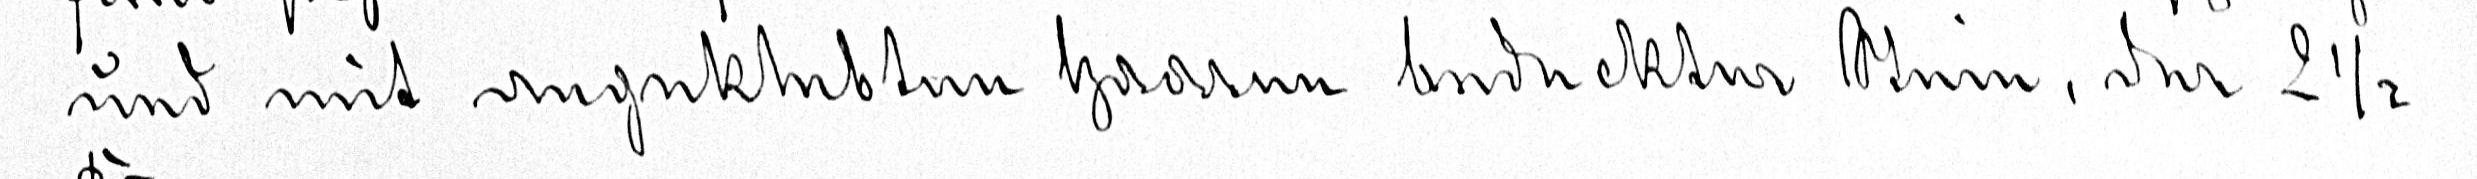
und mit angeklebten Haaren bedeckter Stein, der 2½
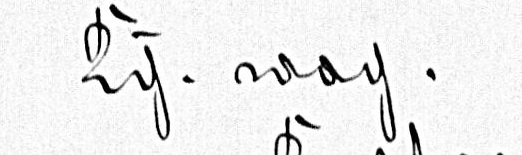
Kg. wog.
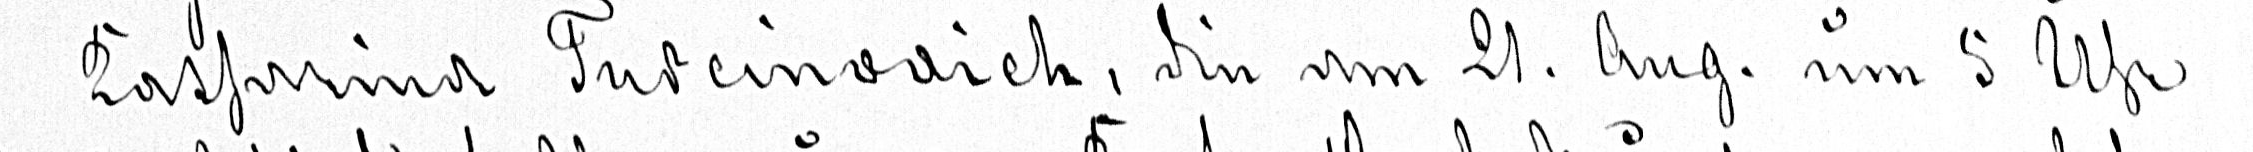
Katharina Turcinovich, die am 21. Aug. um 5 Uhr
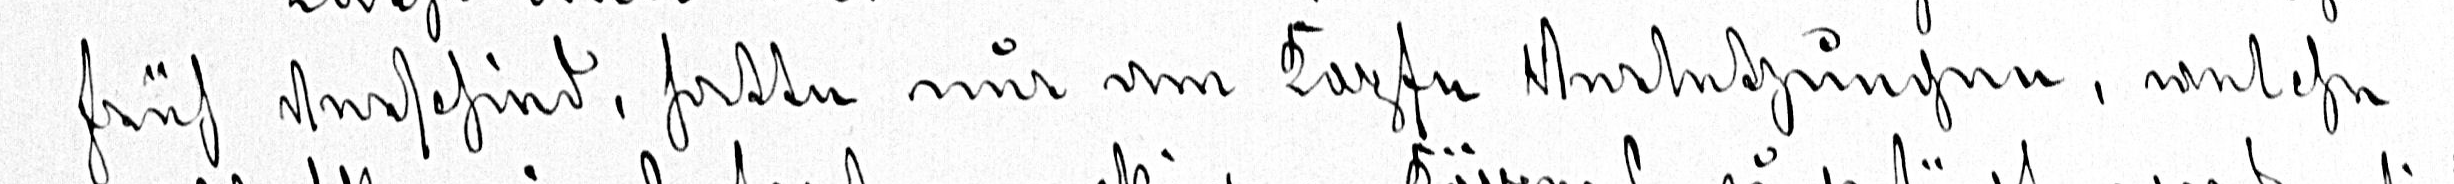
Früh verschied, hatte nur am Kopfe Verletzungen, welche
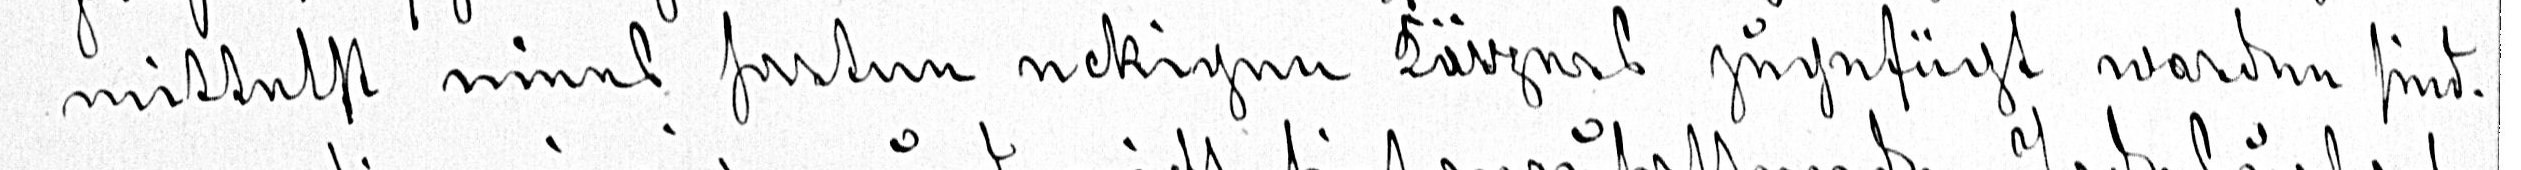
mittelst eines harten eckigen Körpers zugefügt worden sind.
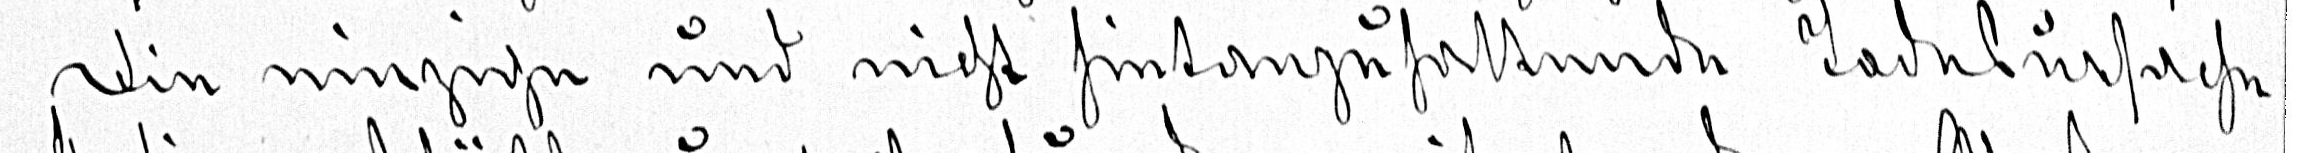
Die einzige und nicht hintanzuhaltende Todesursache
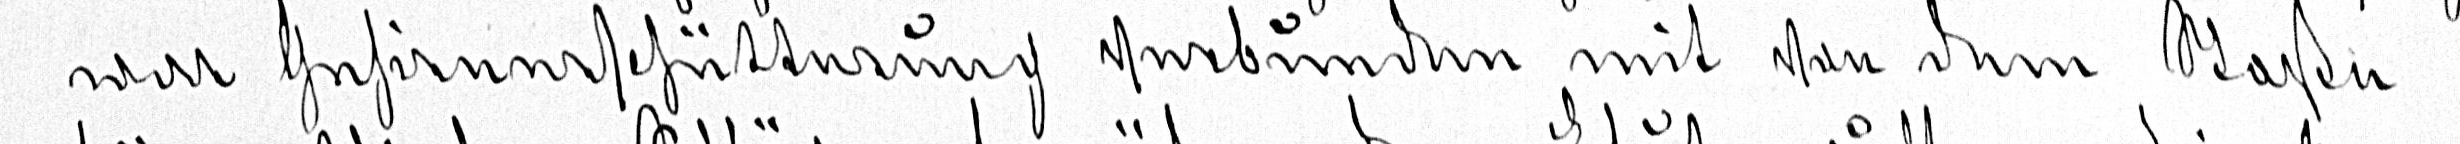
war Gehirnerschütterung verbunden mit von dem Stoße
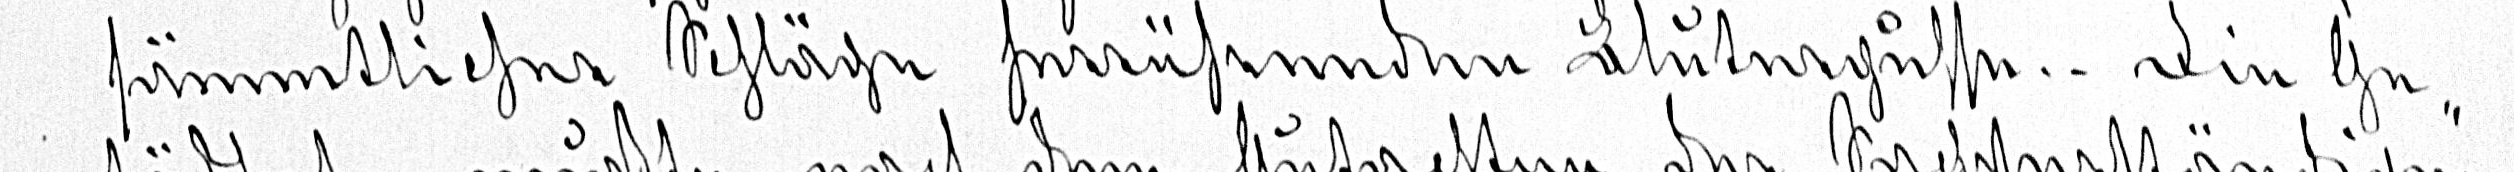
sämmtlicher Schläge herrührenden Blutergusse.- Die Ge¬
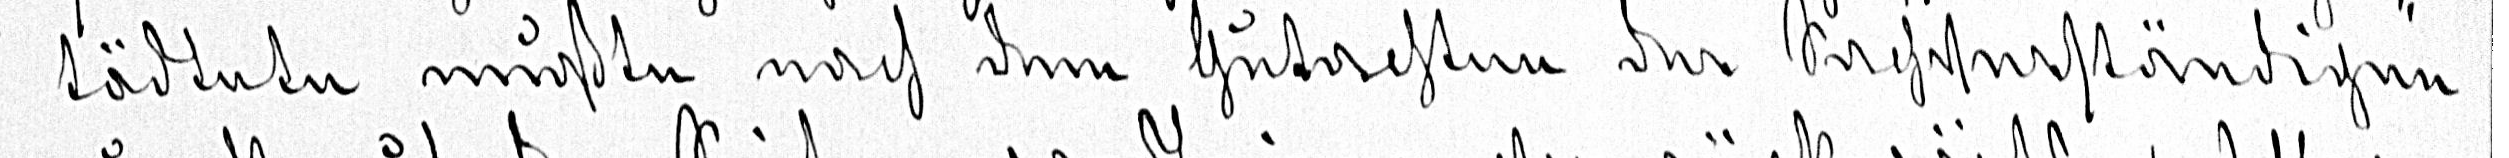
tödtete mußte nach dem Gutachten der Sachverständigen
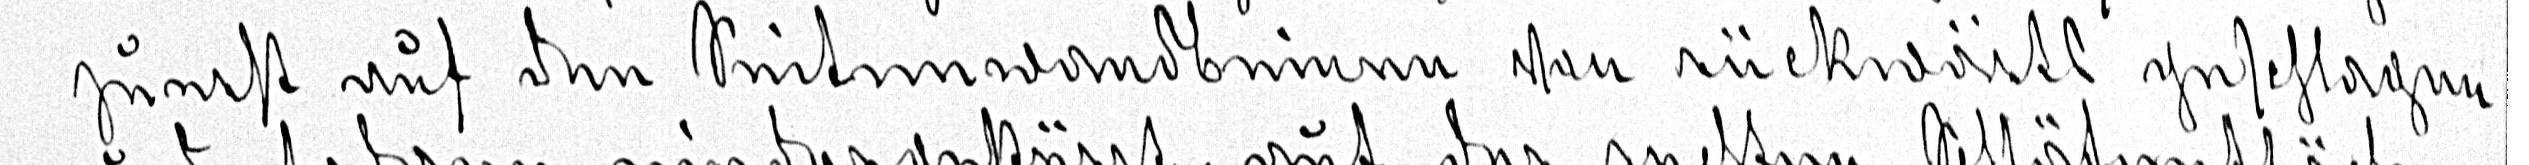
zuerst auf den Seitenwandbeinen von rückwärts geschlagen
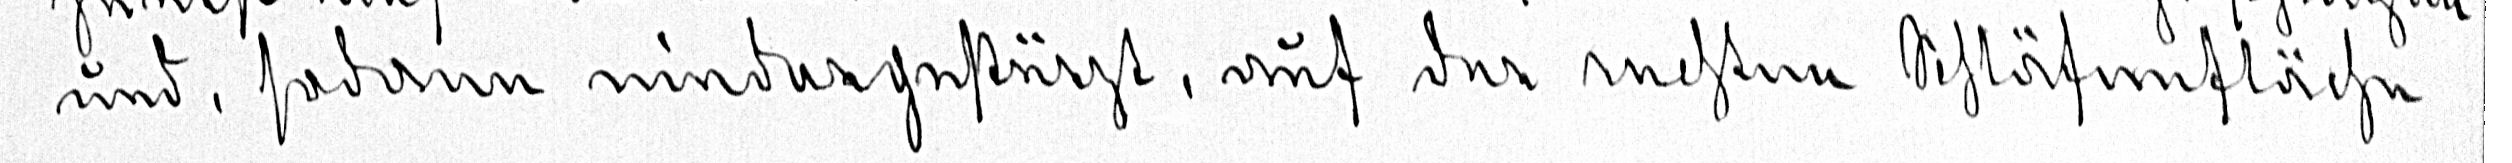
und, sodann niedergestürzt, auf der rechten Schläfenfläche
